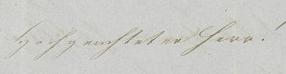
Hochgeachteter Herr!
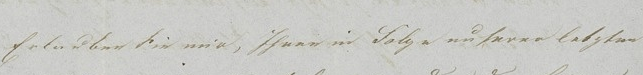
Erlauben Sie mir, Ihnen in Folge unserer letzten
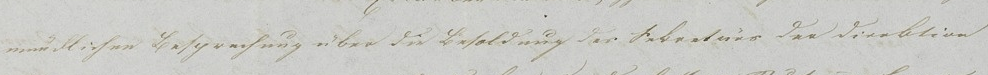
mündlichen Besprechung über die Besoldung des Sekretärs der Direktion
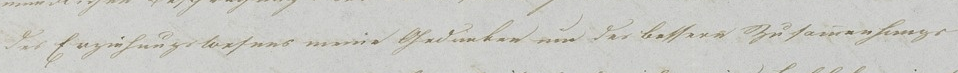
des Erziehungswesens meine Gedanken um des bessern Zusammenhangs
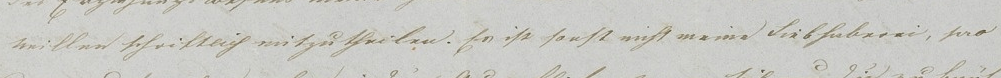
willen schriftlich mitzutheilen. Es ist sonst nicht meine Liebhaberei, pro
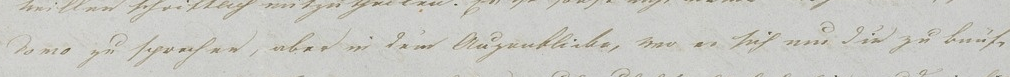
homo zu sprechen, aber in dem Augenblicke, wo es sich um die zukünf-
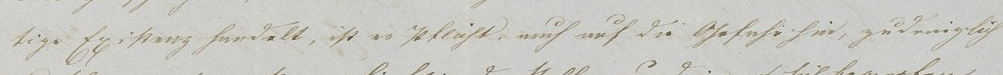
tige Existenz handelt, ist es Pflicht, auch auf die Gefahr hin, zudringlich
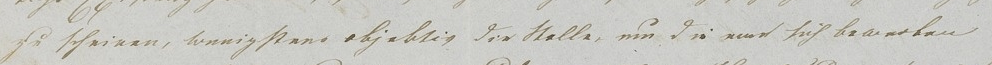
zu scheinen, wenigstens objektiv die Stelle, um die man sich bewerben
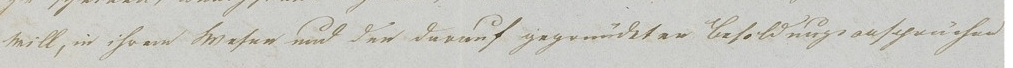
will, in ihrem Wesen und den darauf gegründeten Besoldungsansprüchen
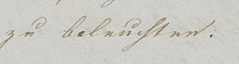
zu beleuchten.
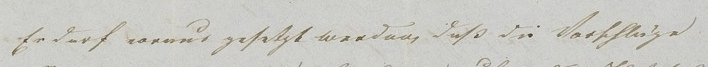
Es darf voraus gesetzt werden, daß die Vorschläge
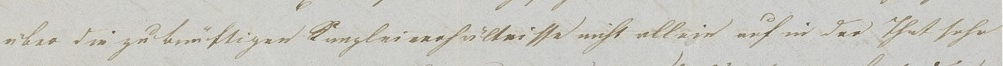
über die zukünftigen Kanzleiverhältnisse nicht allein auf in der That sehr
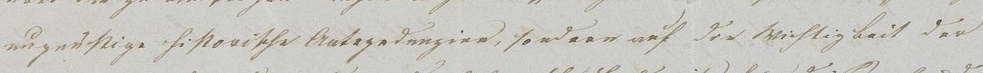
ungünstige historische Antezedenzien, sondern auf der Wichtigkeit der
